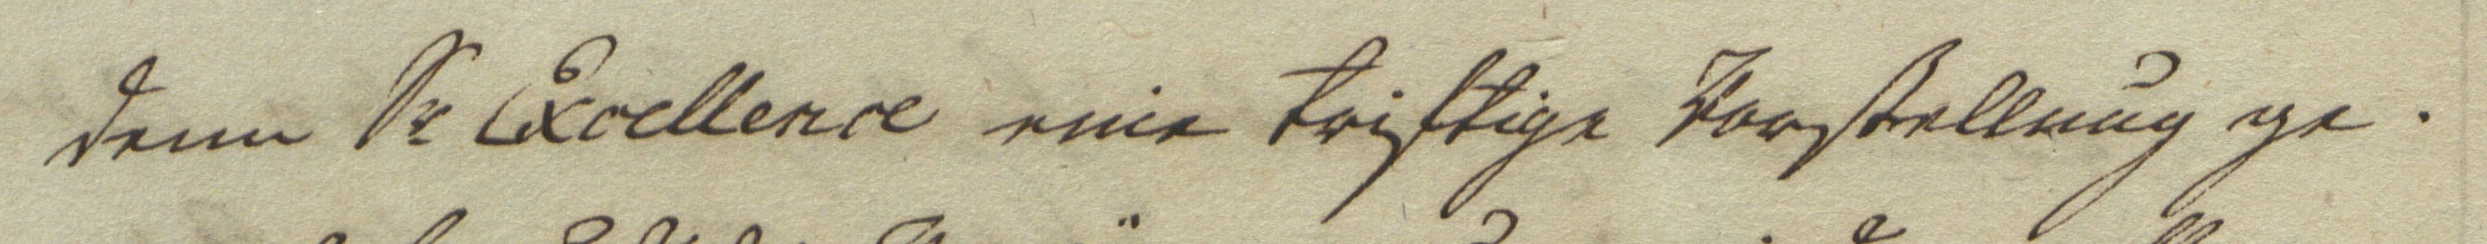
denn Sr. Excellence eine triftige Vorstellung ge¬
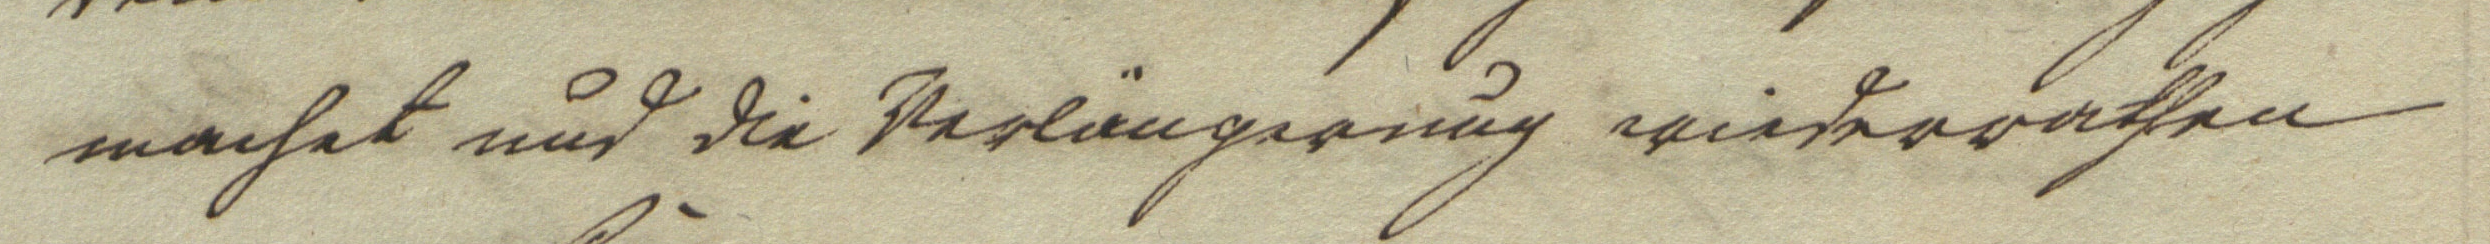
machet und die Verlängerung wiederrathen
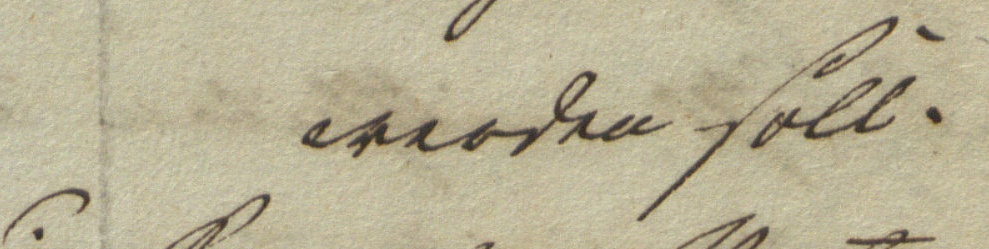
werden soll.
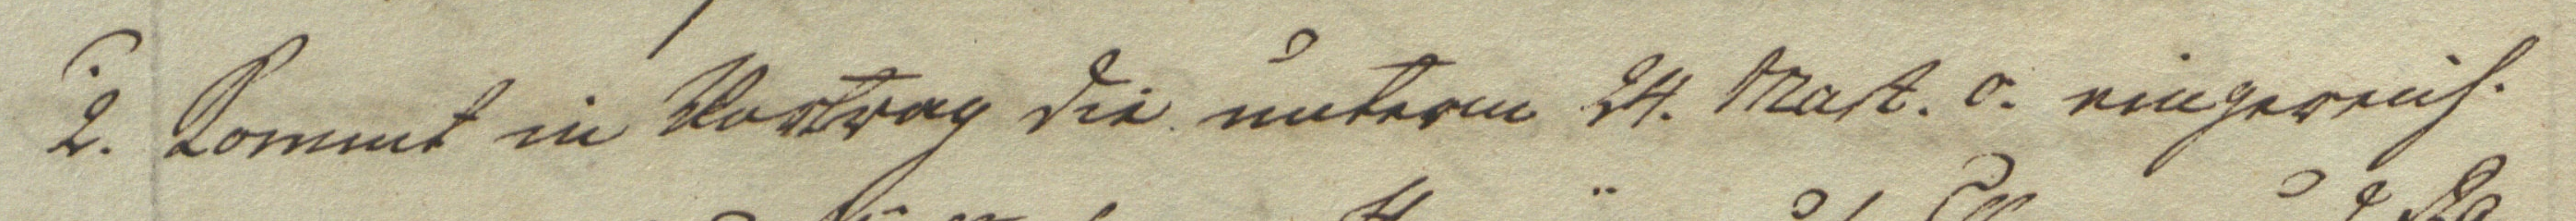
2. Kommt in Vortrag die unterm 24. Mart. c. eingereich¬
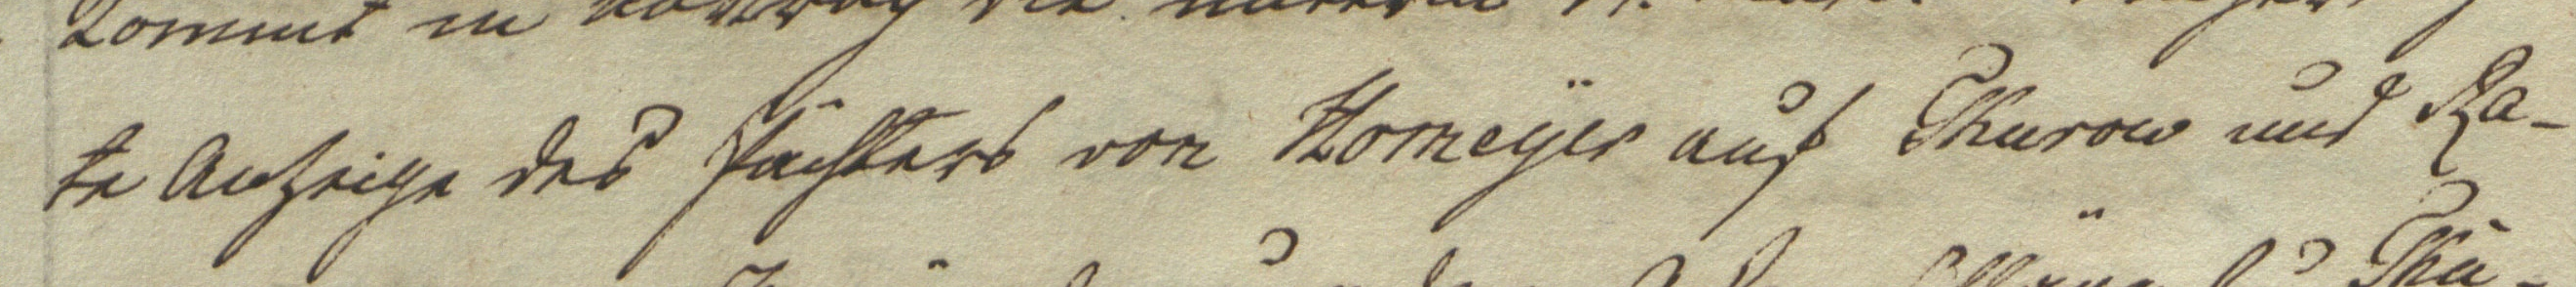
te Anzeige des Pächters von Homeyer auf Thurow und Ra¬
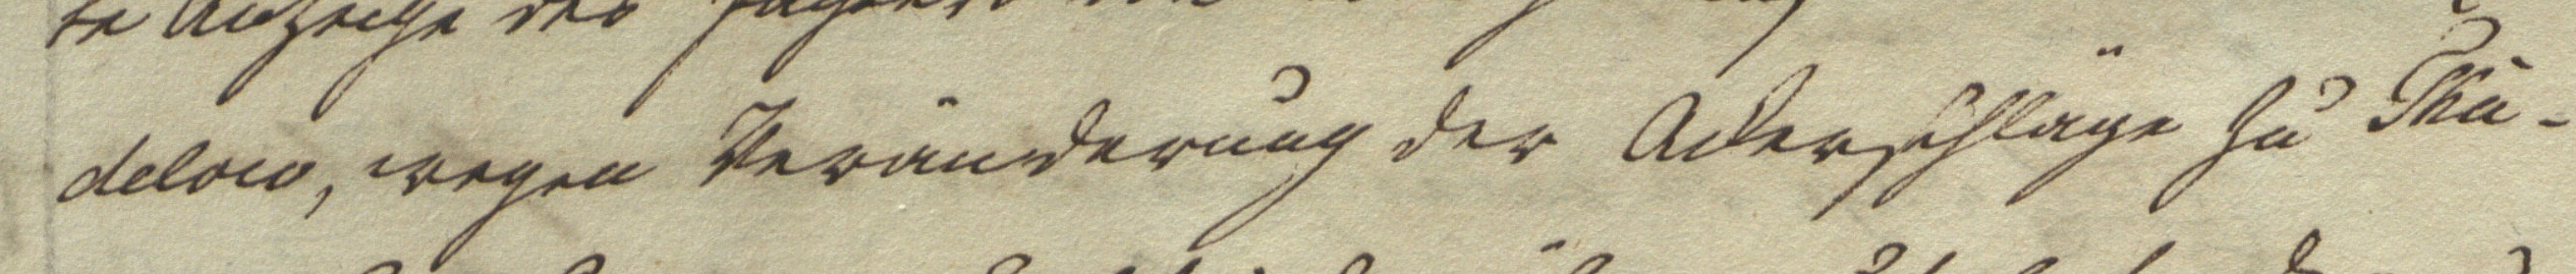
delow, wegen Veränderung der Ackerschläge zu Thu¬
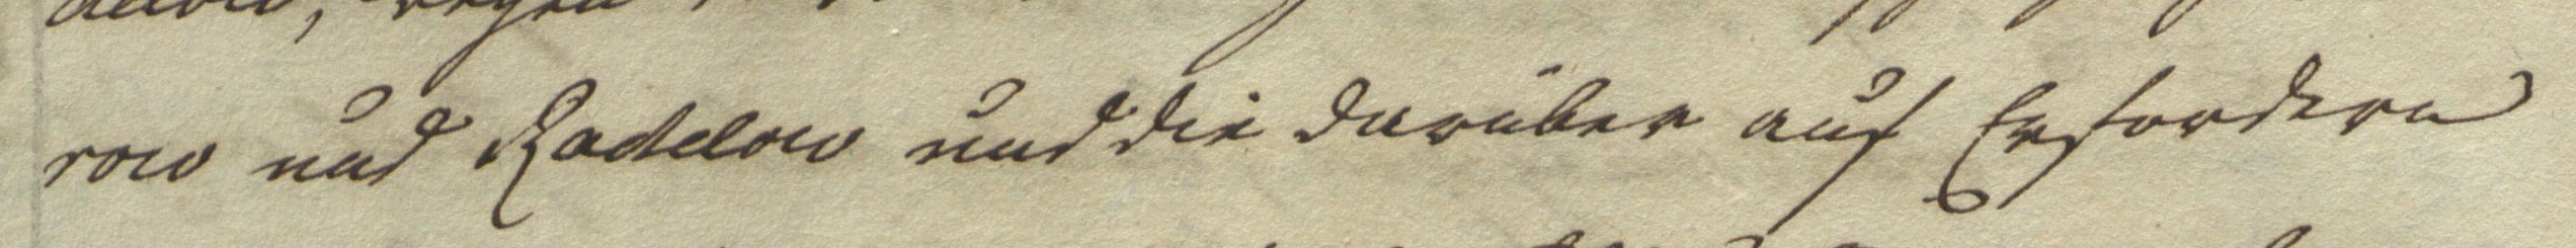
row und Radelow und die darüber auf Erfordern
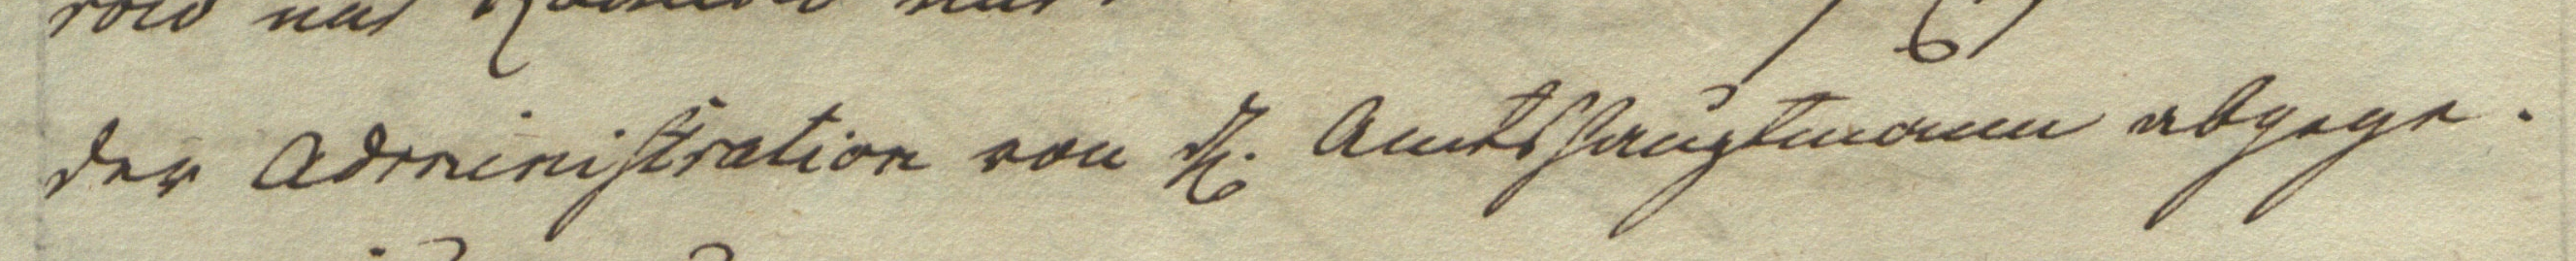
der Administration von dh. Amtshauptmann abgege¬
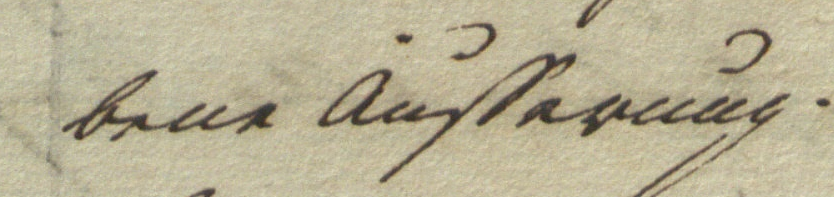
bene Äusserung.
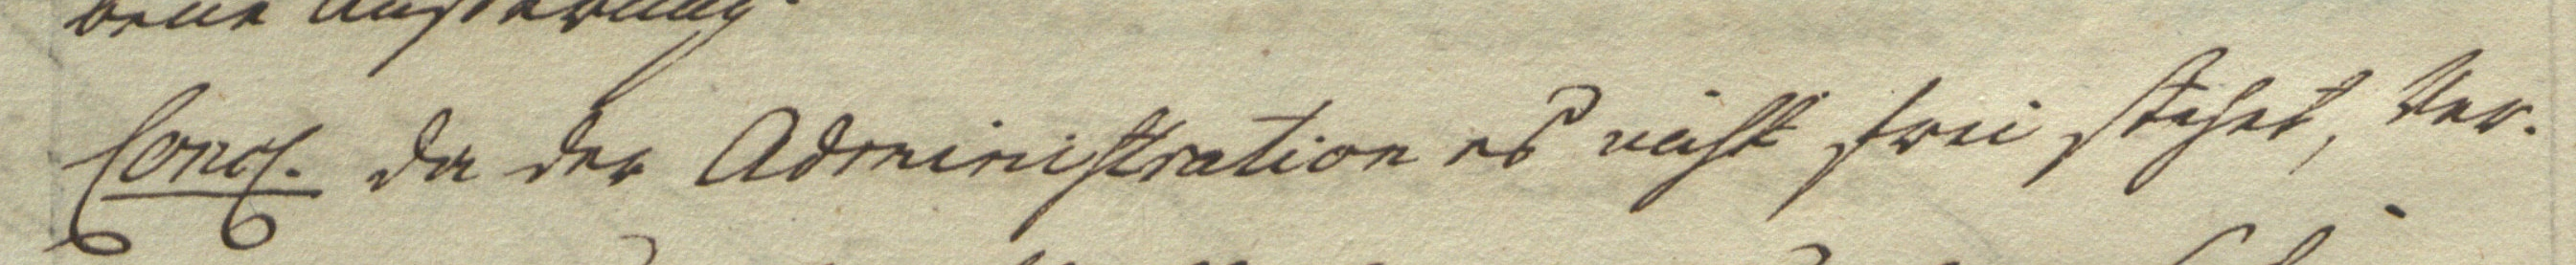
Concl. da der Administration es nicht frei stehet, Ver¬
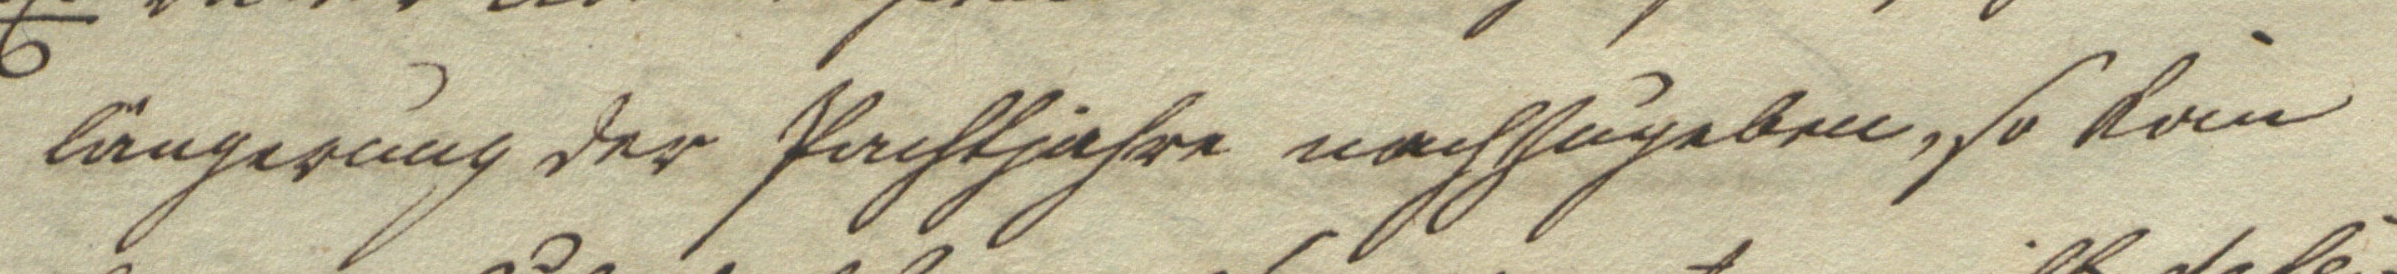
längerung der Pachtjahre nachzugeben, so kan
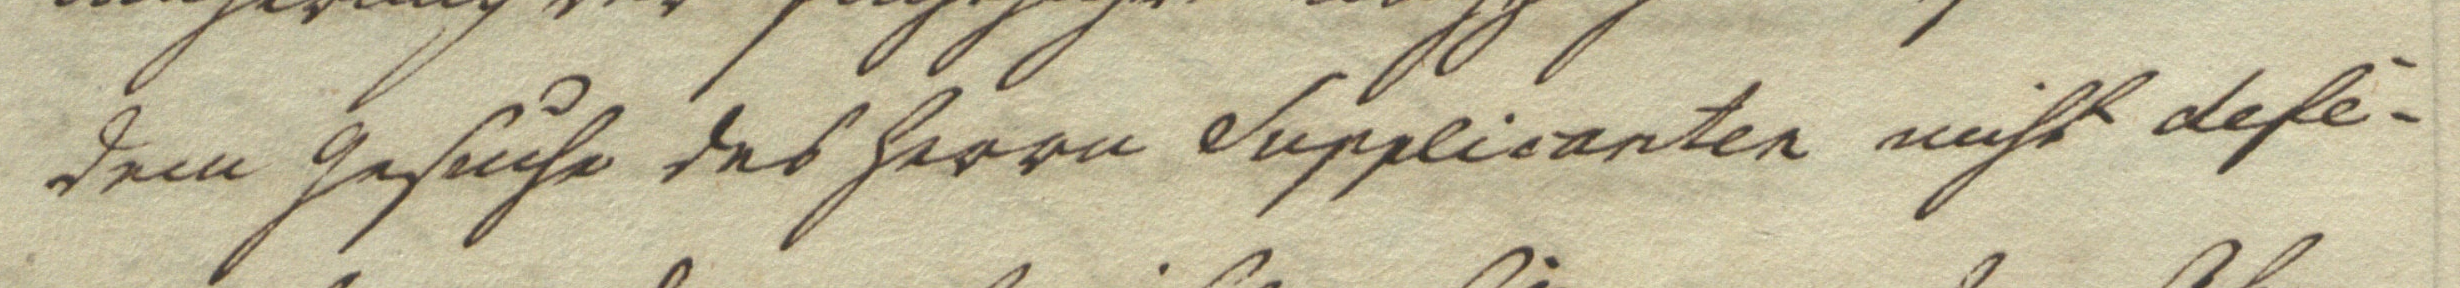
dem Gesuche des Herrn Supplicanten nicht defe¬
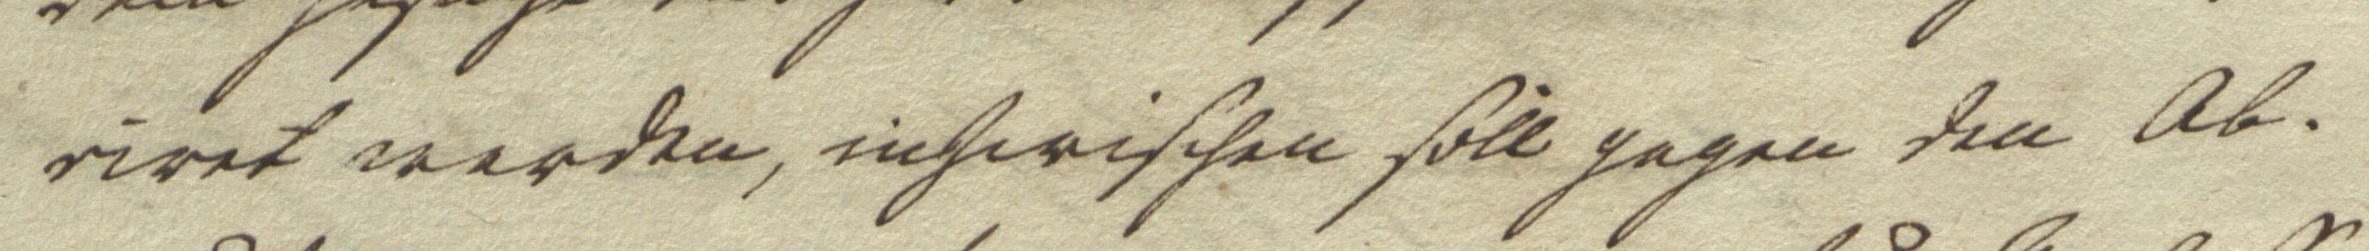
riret werden, inzwischen soll gegen den Ab¬
